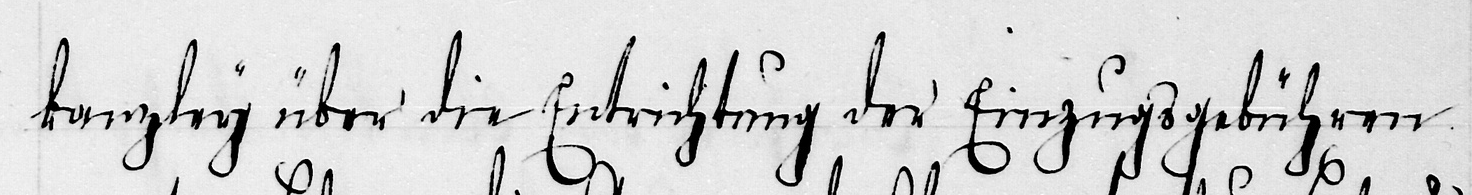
kanzley über die Entrichtung der Einzugsgebühren
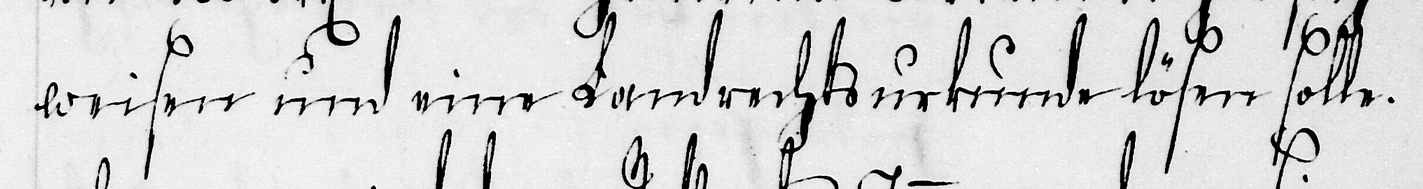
weisen und eine Landrechtsurkunde lösen solle.
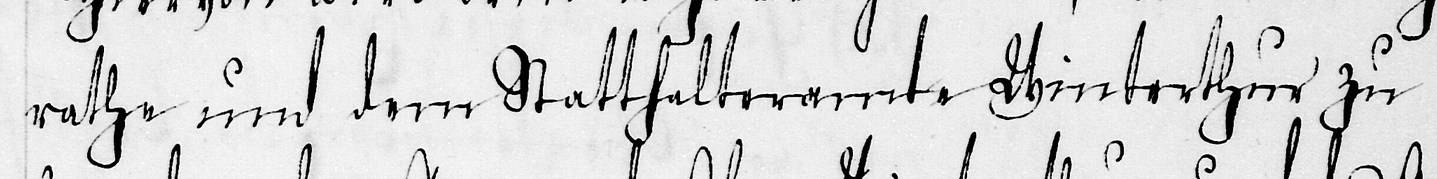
rathe und dem Statthalteramte Winterthur zu
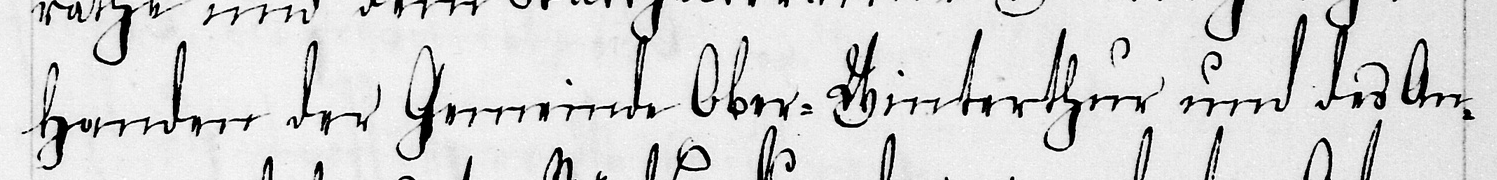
Handen der Gemeinde Ober-Winterthur und des An¬
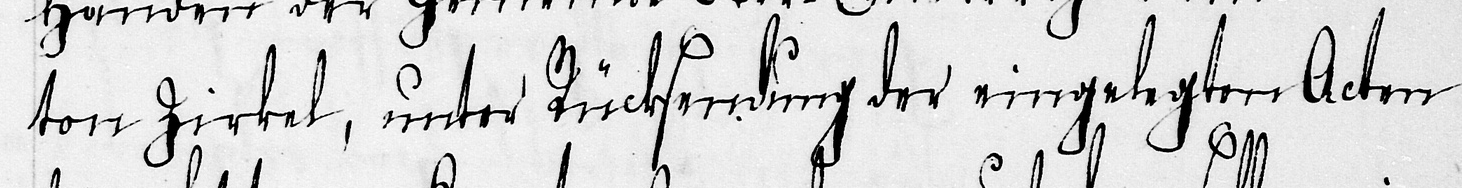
ton Zirkel, unter Rücksendung der eingelegten Acten
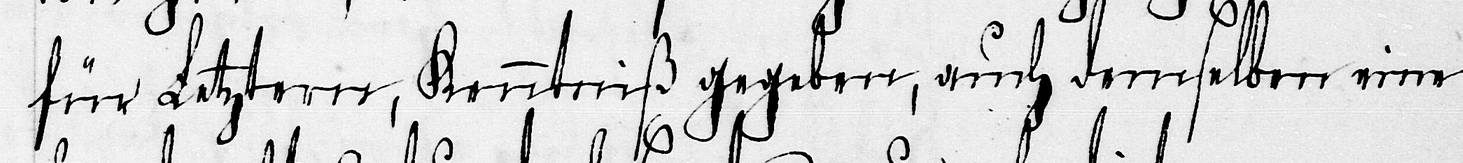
für Letztern, Kenntniß gegeben, auch demselben eine
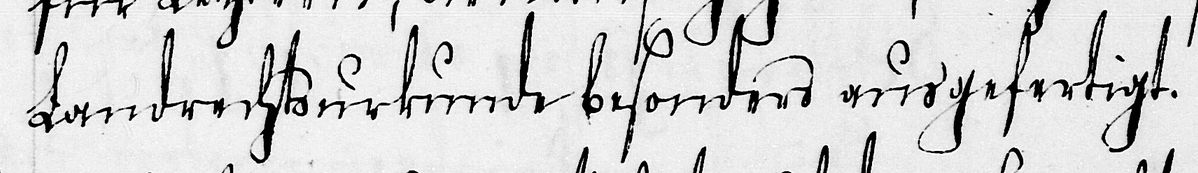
Landrechtsurkunde besonders ausgefertigt.
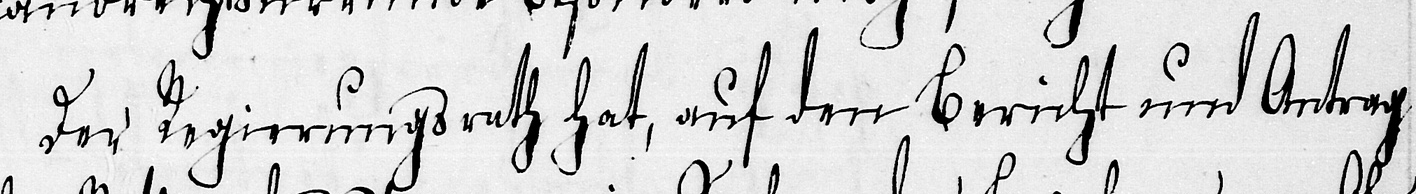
Der Regierungsrath hat, auf den Bericht und Antrag
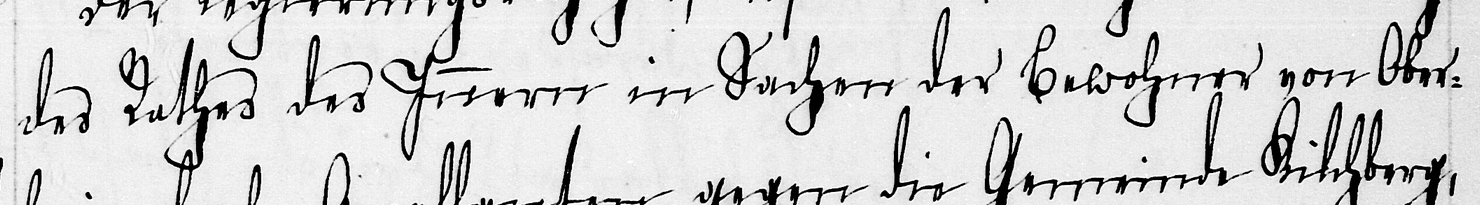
des Rathes des Innern in Sachen der Bewohner von Ober¬
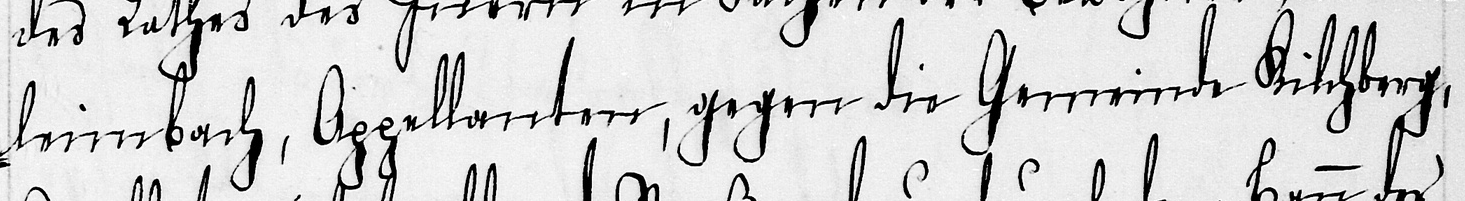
leimbach, Appellanten, gegen die Gemeinde Kilchberg,
